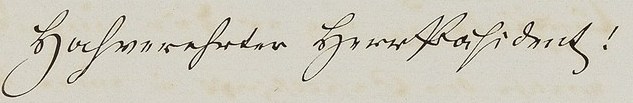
Hochverehrter Herr Präsident!
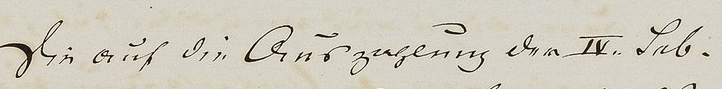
Die auf die Auszahlung der IV. Sub-
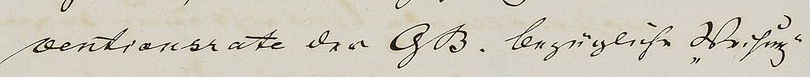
ventionsrate der GB. bezügliche «Weisung»
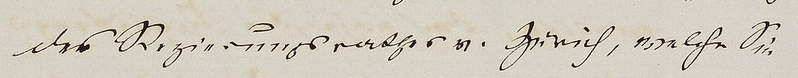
des Regierungsrathes v. Zürich, welche Sie
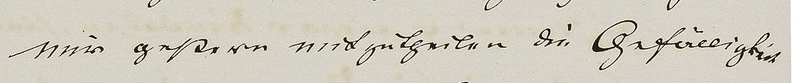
mir gestern mitzutheilen die Gefälligkeit
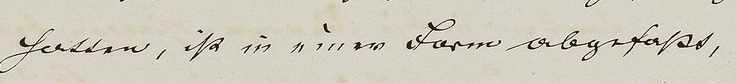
hatten, ist in einer Form abgefaßt,
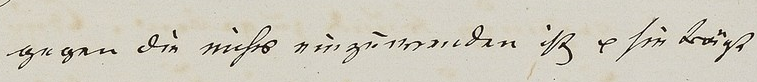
gegen die nichts einzuwenden ist & sie trägt
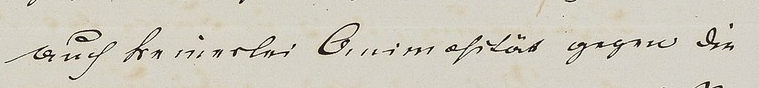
auch keinerlei Animosität gegen die
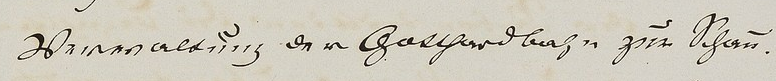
Verwaltung der Gotthardbahn zur Schau.
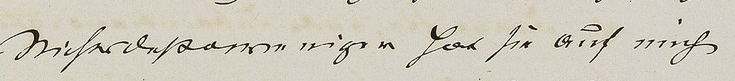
Nichtsdestoweniger hat sie auf mich
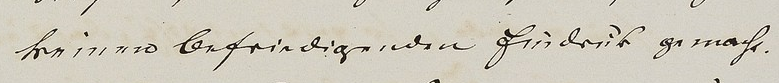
keinen befriedigenden Eindruk gemacht.
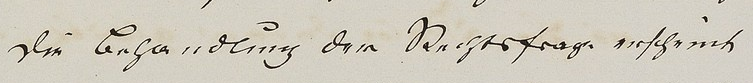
Die Behandlung der Rechtsfrage erscheint
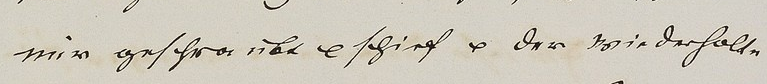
mir geschraubt & schief & der wiederholte
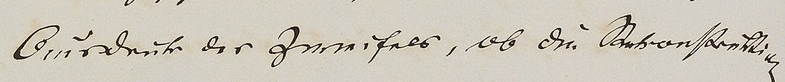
Ausdruk des Zweifels, ob die Rekonstruktion
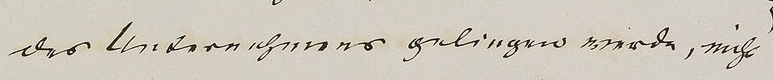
des Unternehmens gelingen werde, nicht
